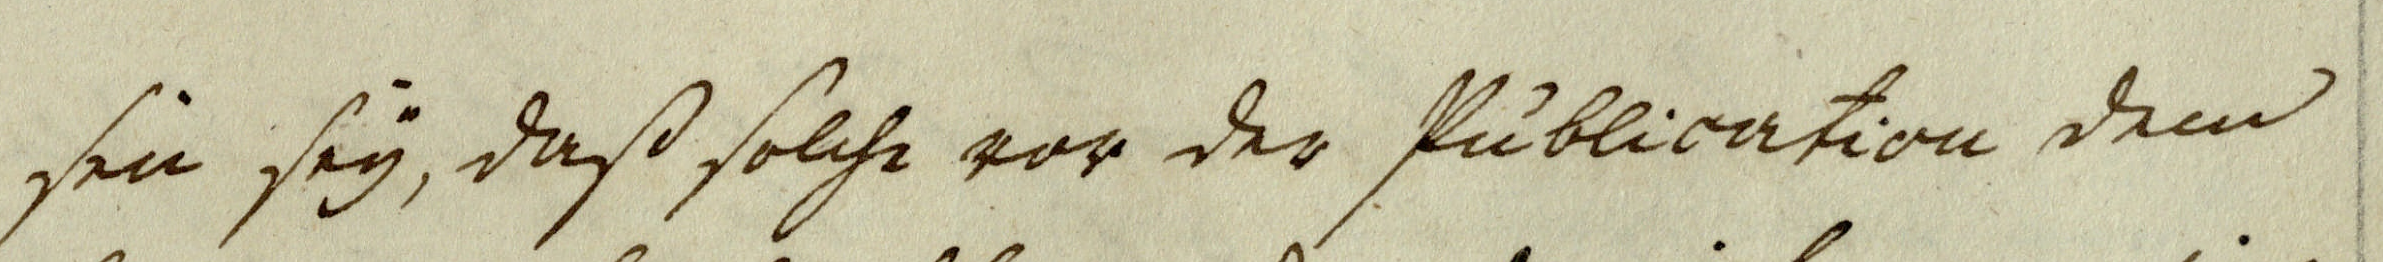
sein seÿ, daß solche vor der Publication dem
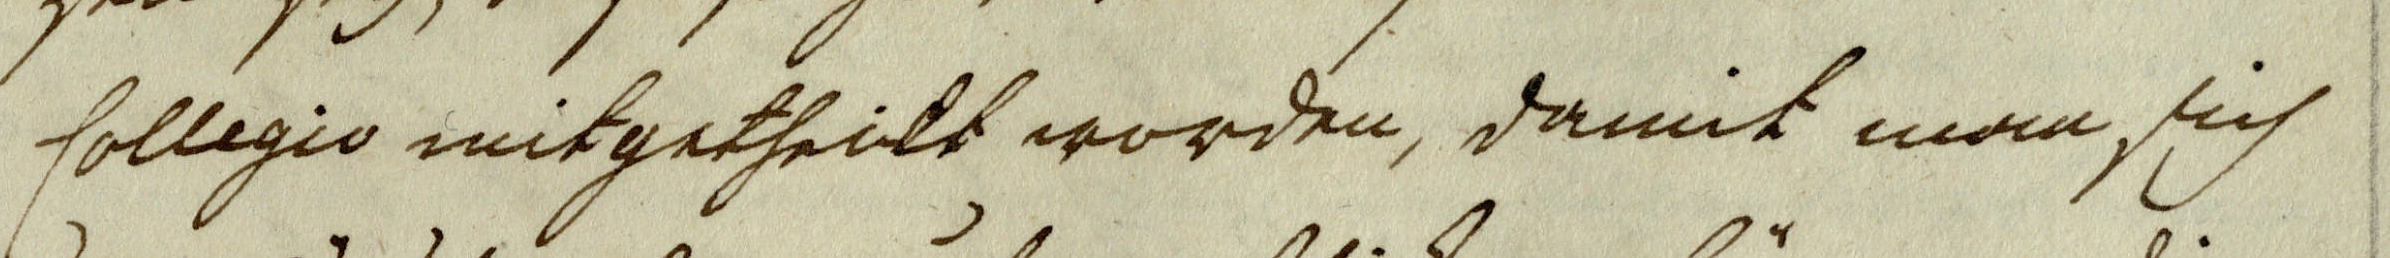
Collegio mitgetheilt worden, damit man sich
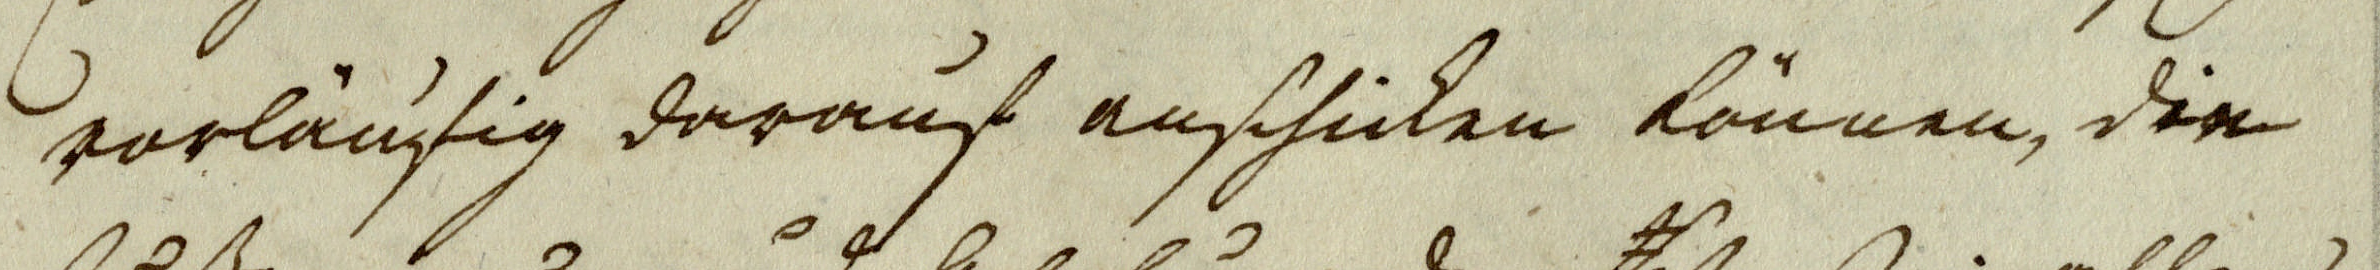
vorläufig darauf anschicken können, die
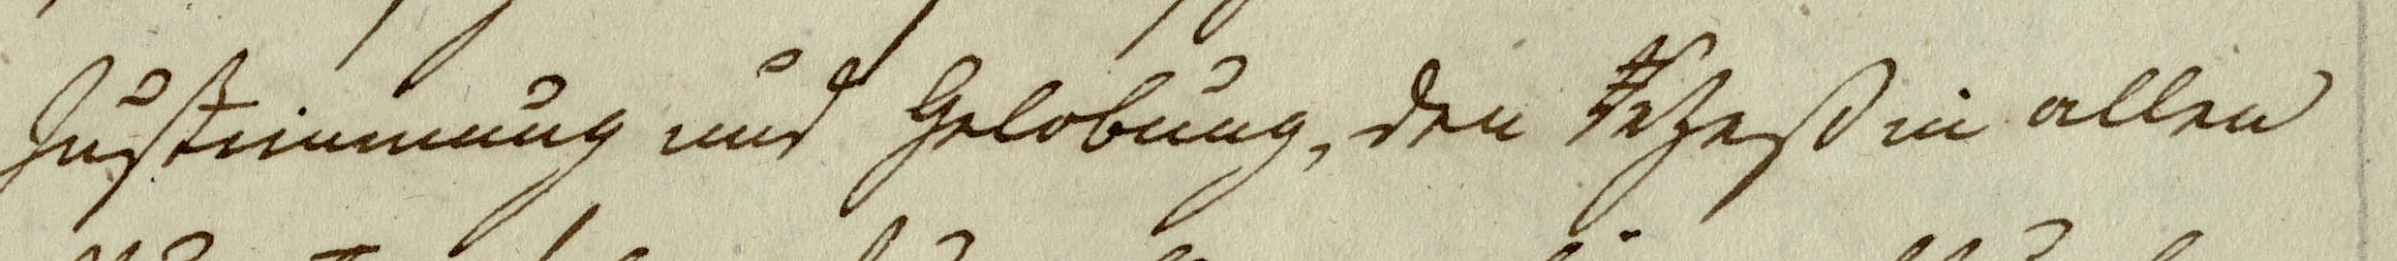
Zustimmung und Gelobung, den Rezeß in allen
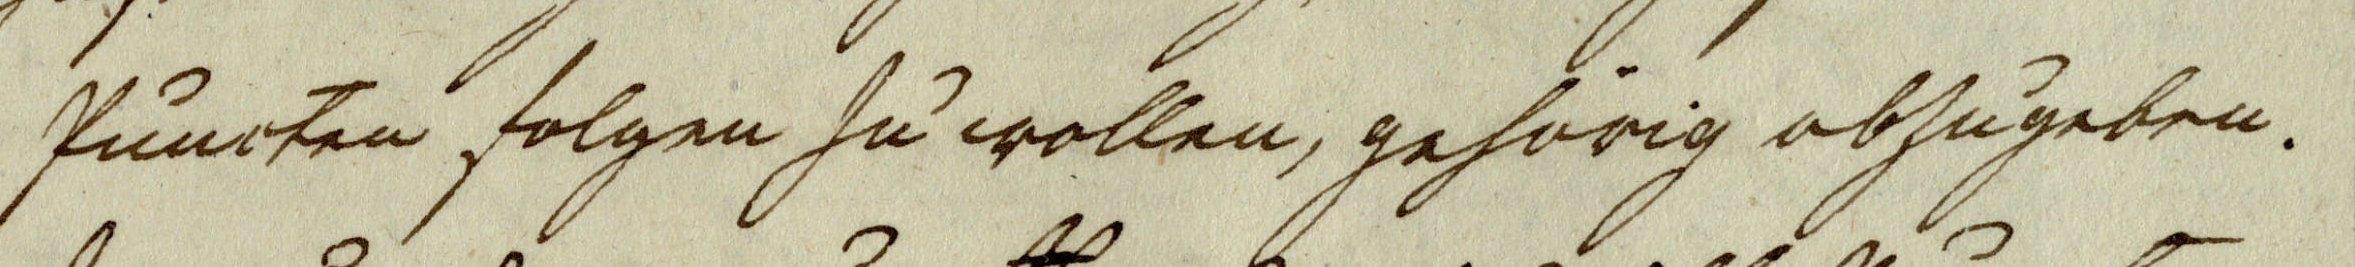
Punkten folgen zu wollen, gehörig abzugeben.
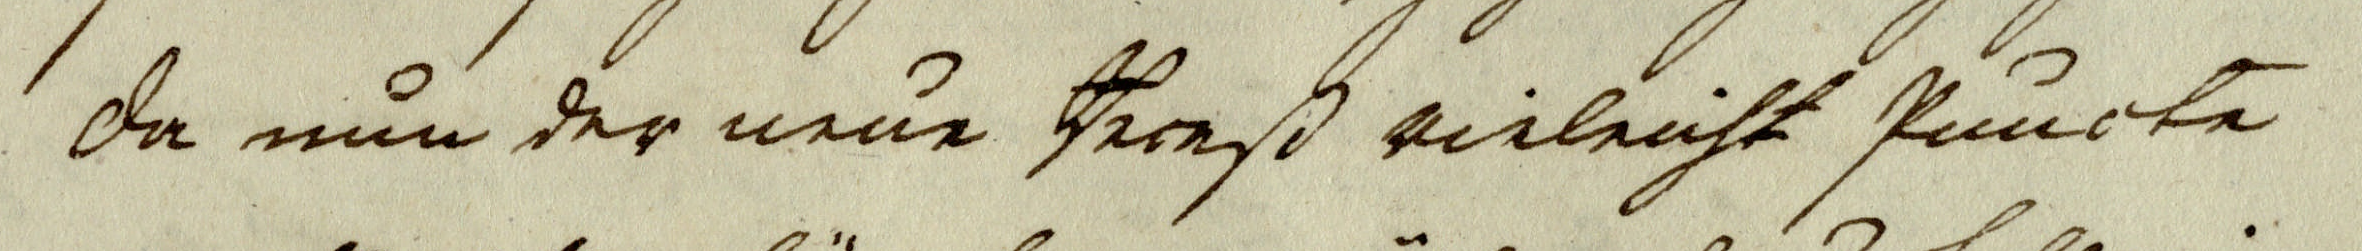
Da nun der neue Receß vieleicht Puncte
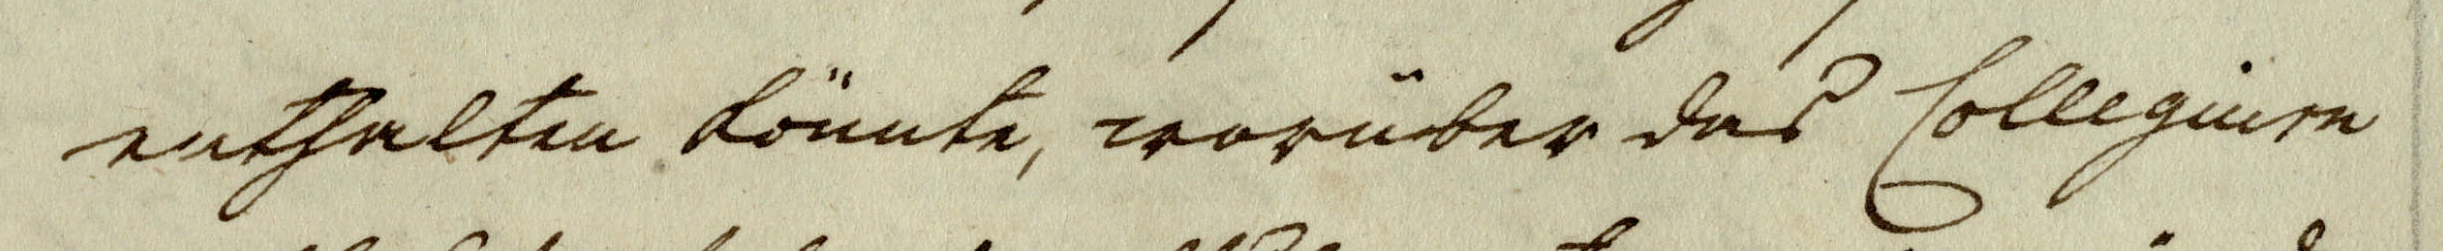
enthalten könnte, worüber das Collegium
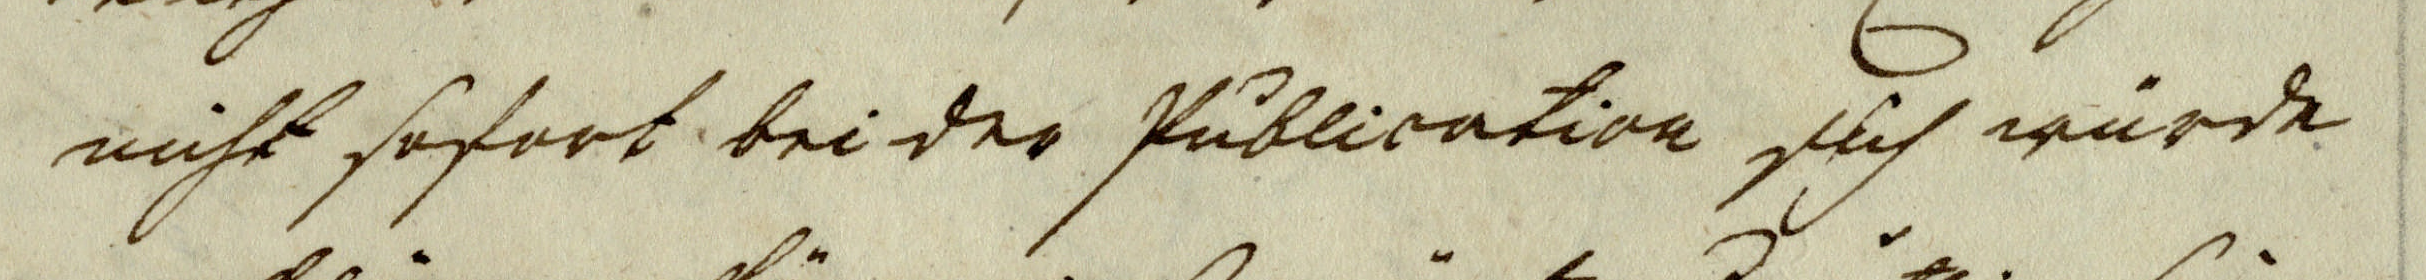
nicht sofort bei der Publication sich würde
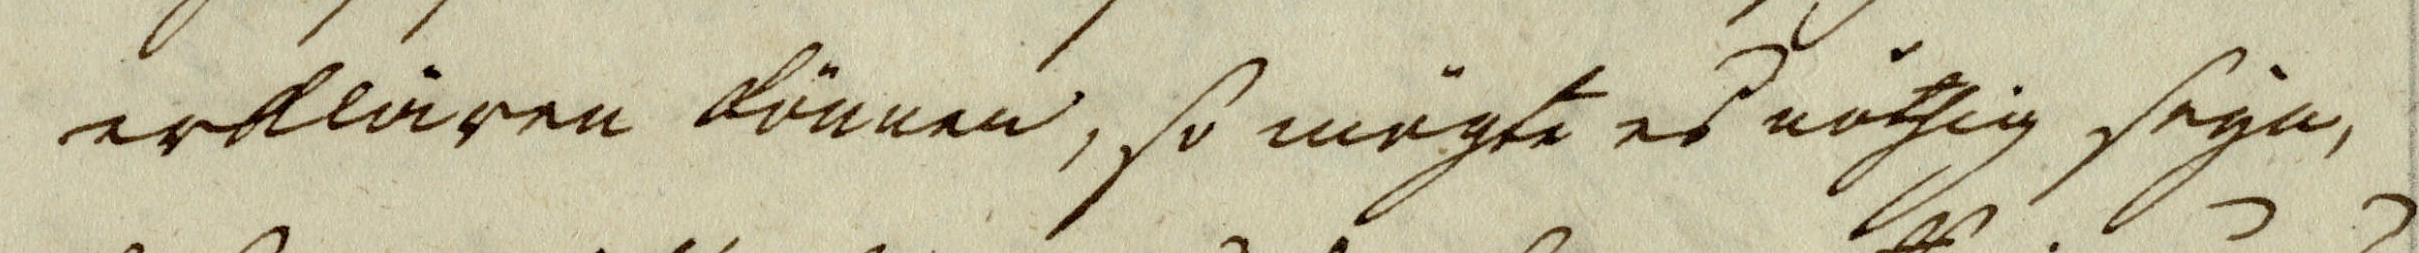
erklären können, so mögte es nöthig seÿn,
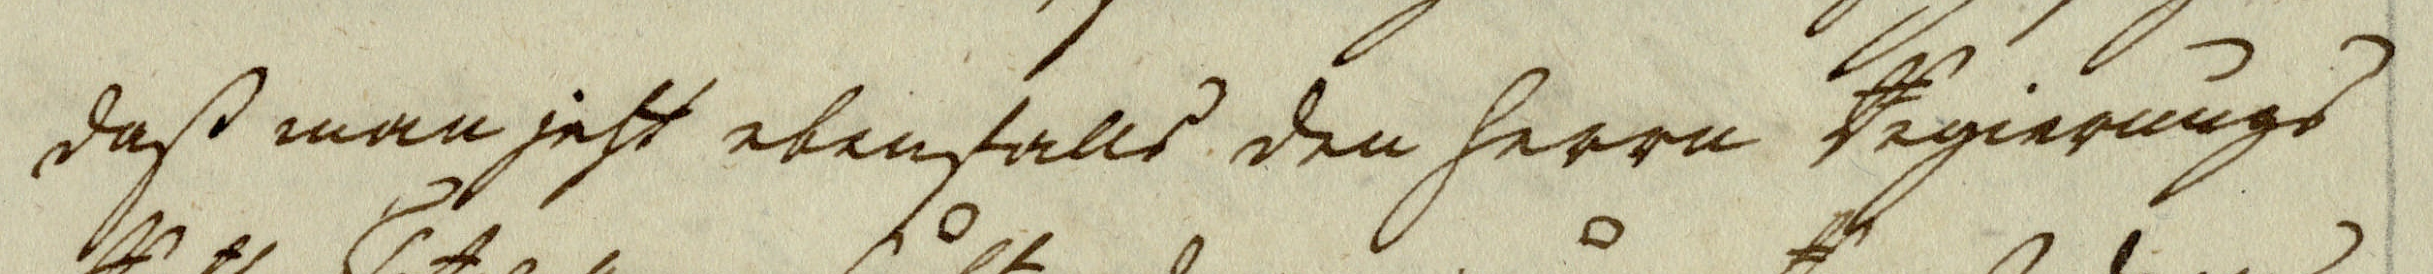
daß man jetzt ebenfalls den Herrn Regierungs
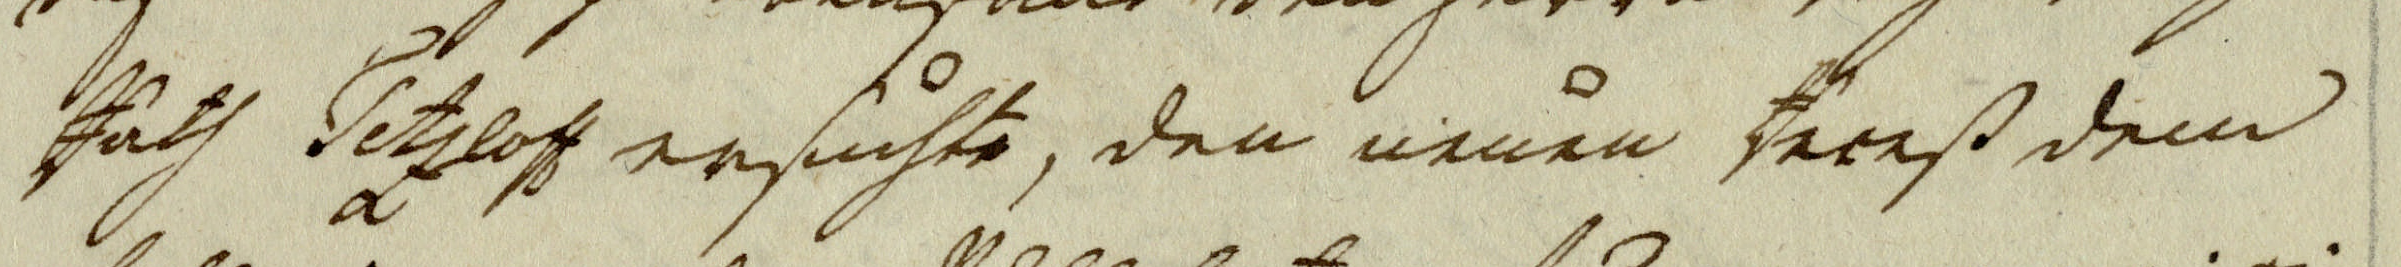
Rath Tetzloff ersuchte, den neuen Receß dem
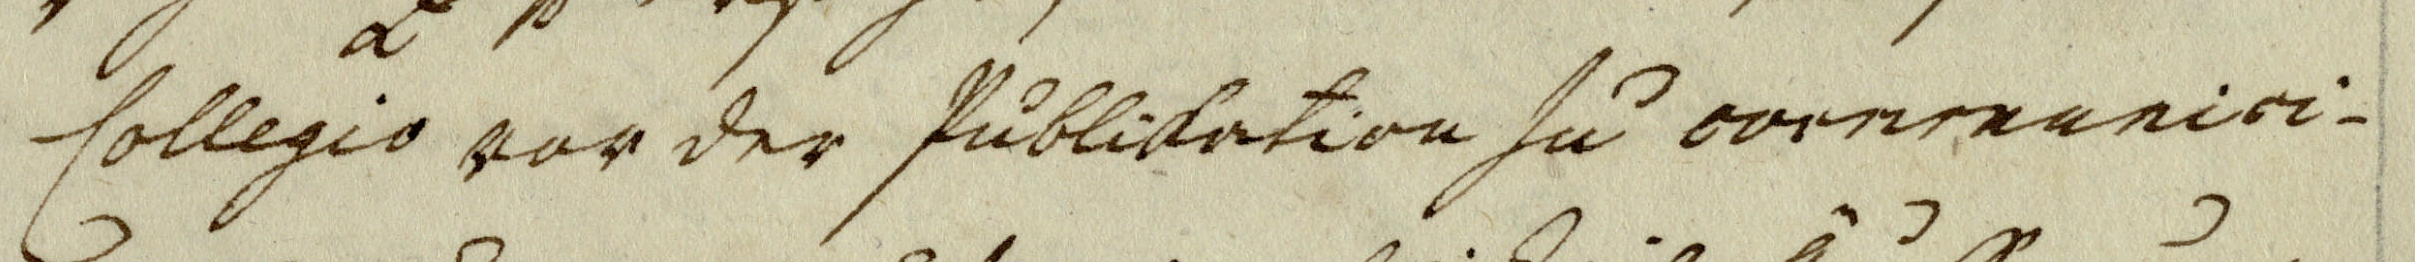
Collegio vor der Publikation zu communici¬
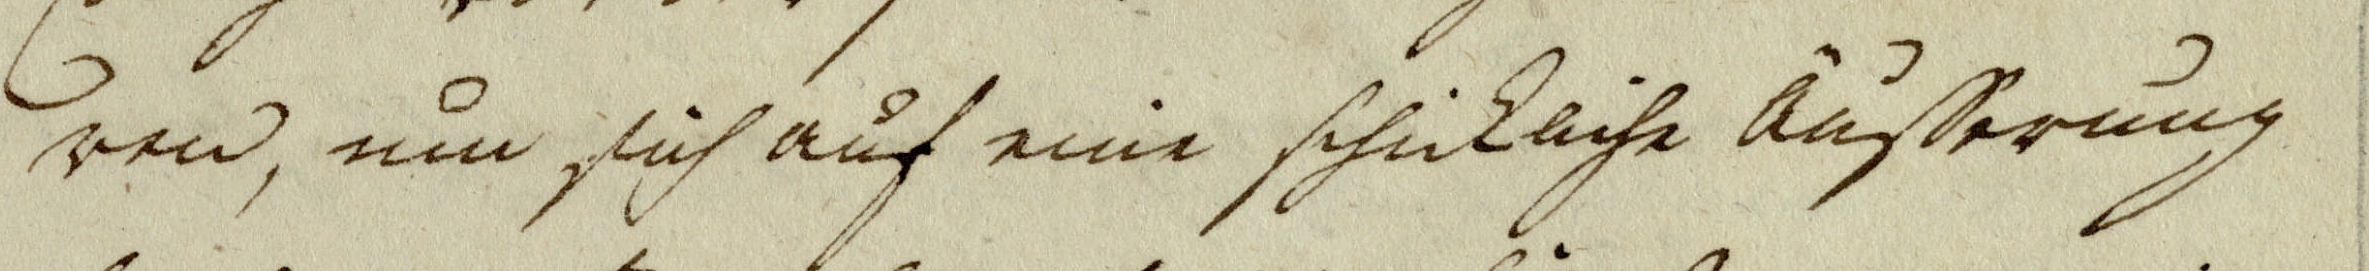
ren, um sich auf eine schickliche Äusserung
